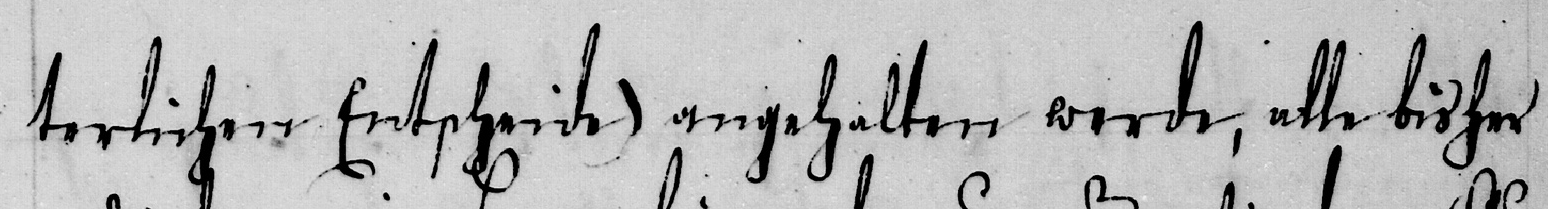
terlichen Entscheide) angehalten werde, alle bisher
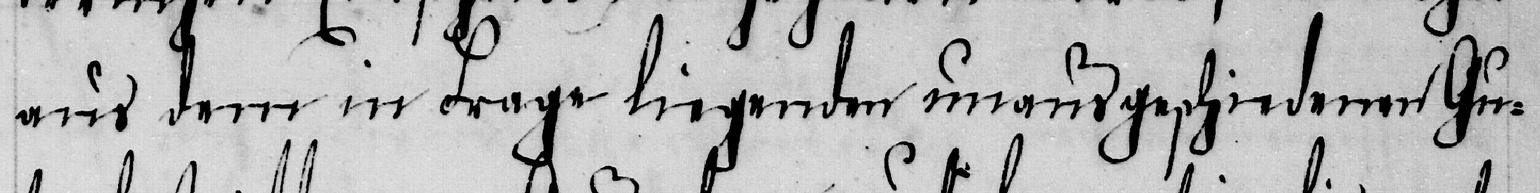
aus dem in Frage liegenden unausgeschiedenen Gu¬
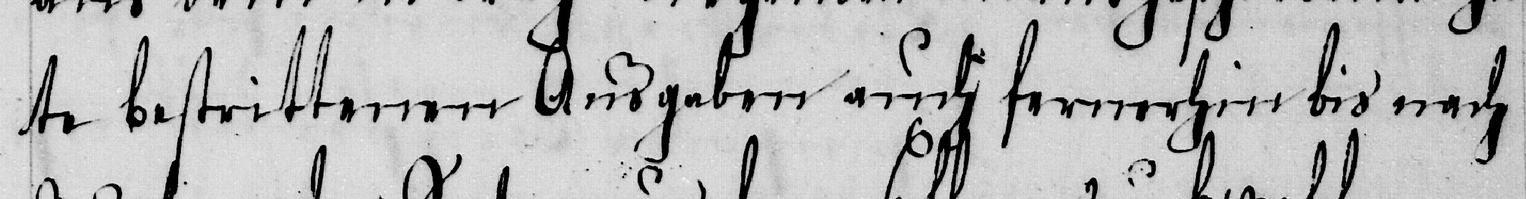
te bestrittenen Ausgaben auch fernerhin bis nach
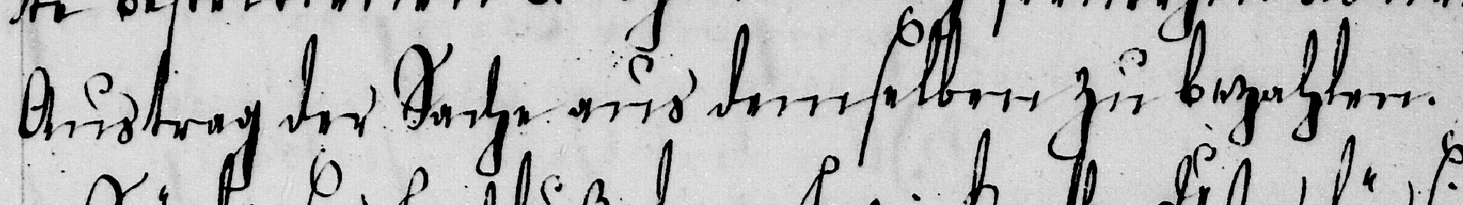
Austrag der Sache aus demselben zu bezahlen.
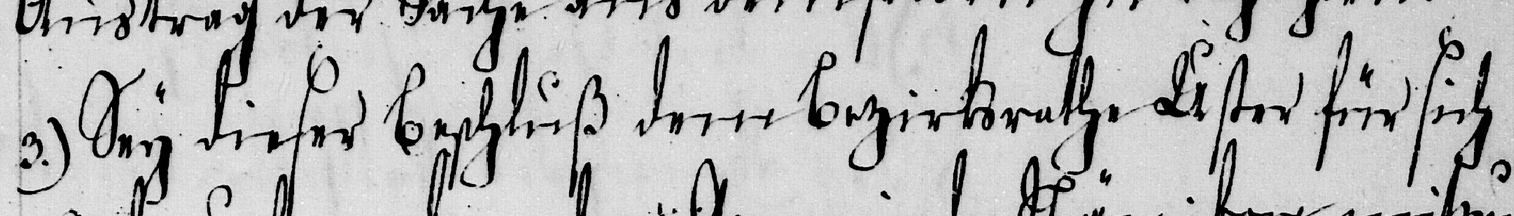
3.) Sey dieser Beschluß dem Bezirksrathe Uster für sich
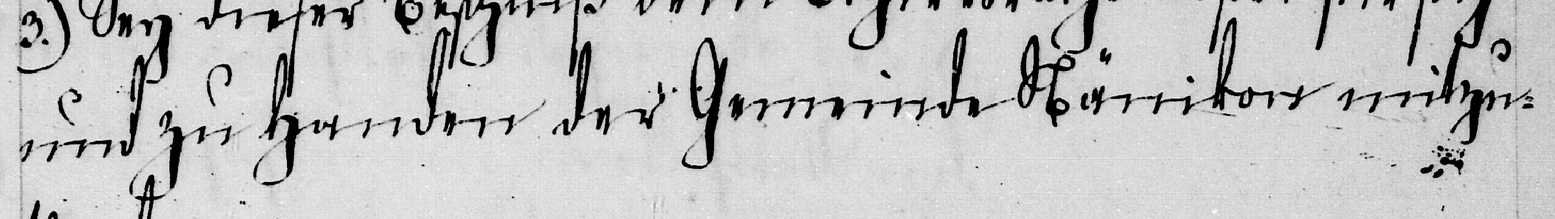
und zu Handen der Gemeinde Nänikon mitzu¬
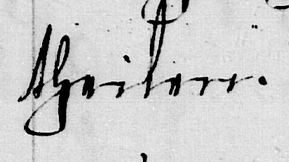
theilen.
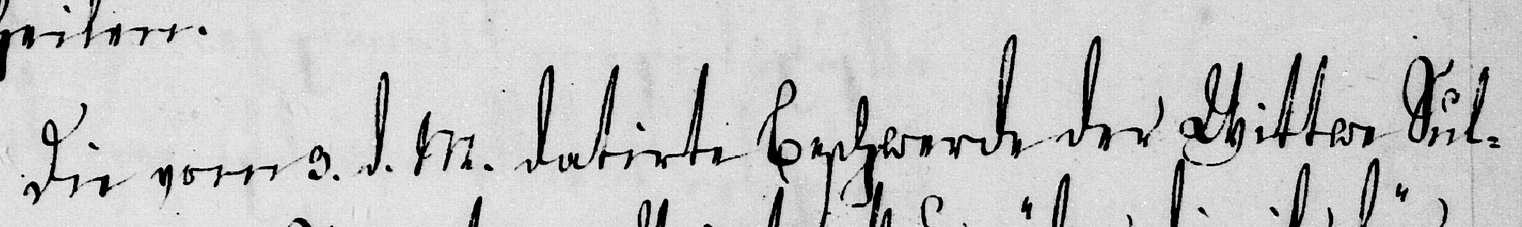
Die vom 3. d. M. datirte Beschwerde der Wittwe Sul¬
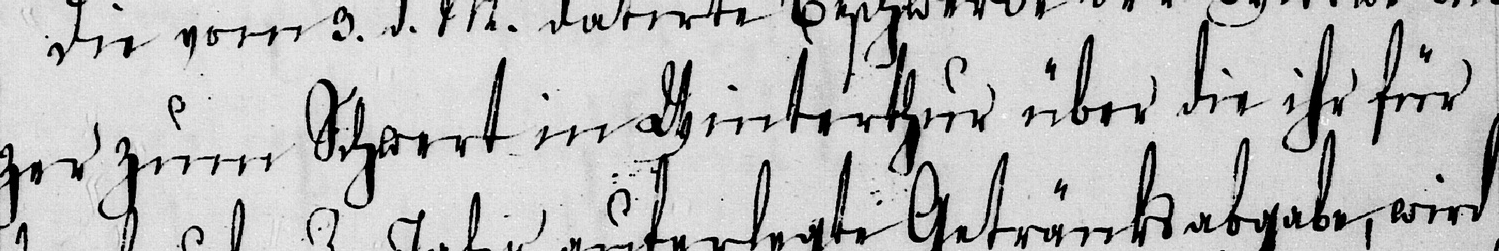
zer zum Schwert in Winterthur über die ihr für
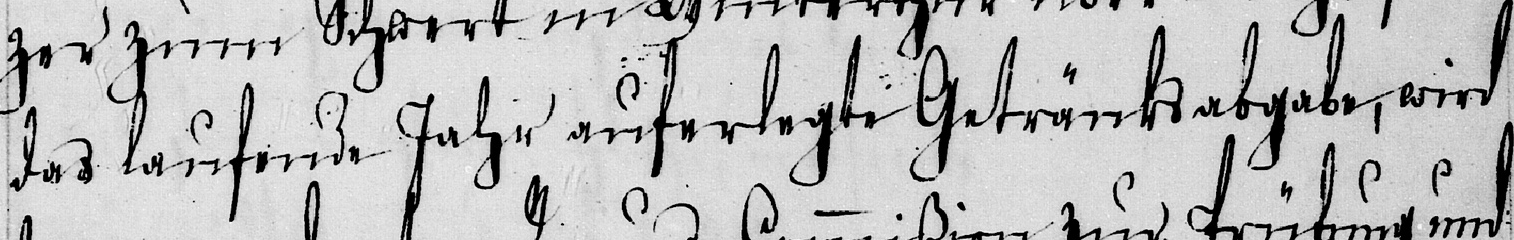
das laufende Jahr auferlegte Getränksabgabe, wird
